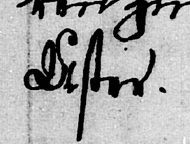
Uster,
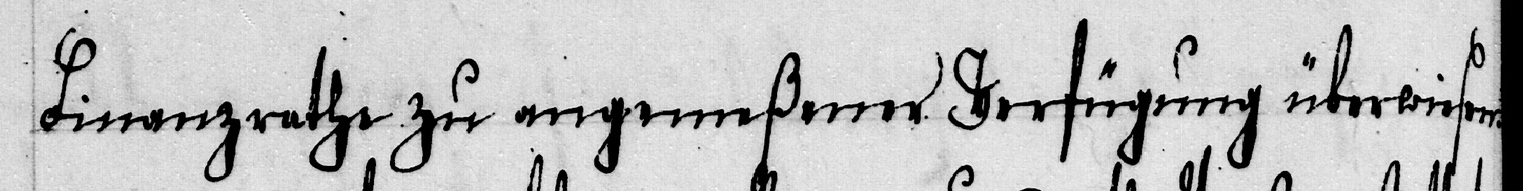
Finanzrathe zu angemeßener Verfügung überwiese¬
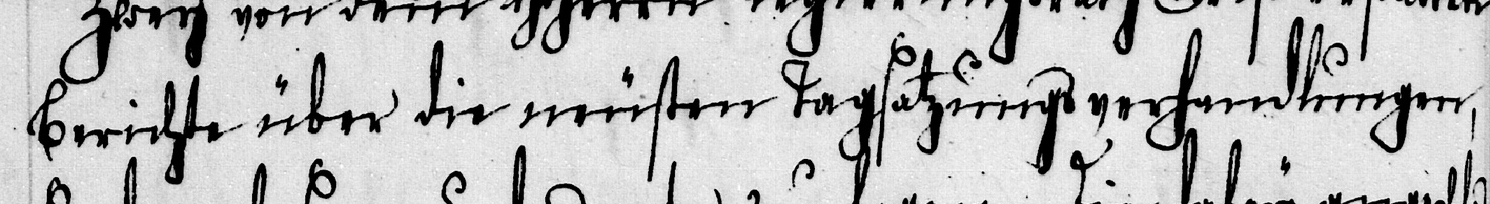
Berichte über die neusten Tagsatzungsverhandlungen,
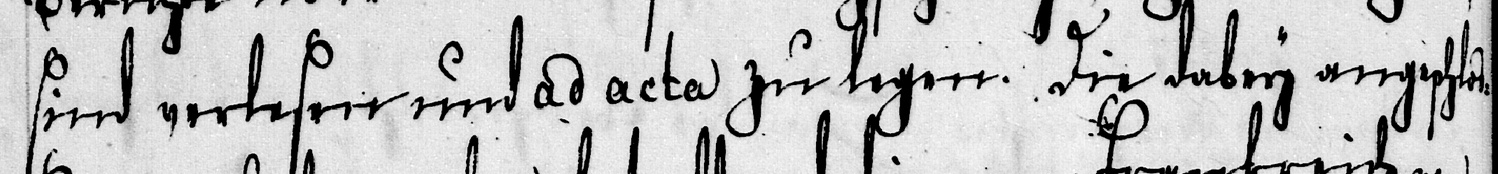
sind verlesen und ad acta zu legen. Die dabey angesch¬
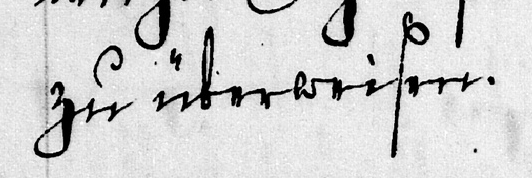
zu überweisen.
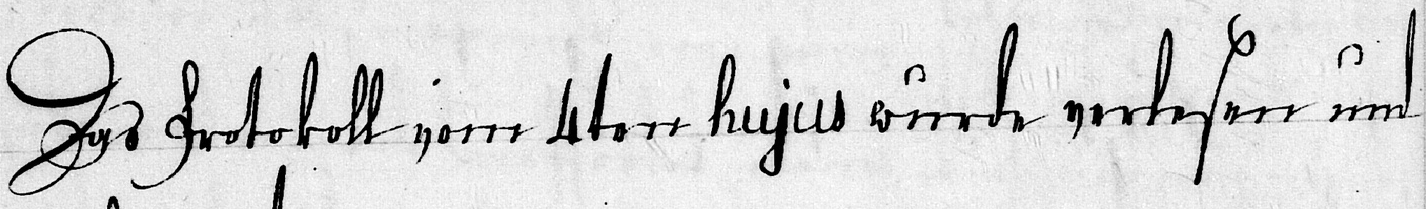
Das Protokoll vom 4ten. hujus wurde verlesen und
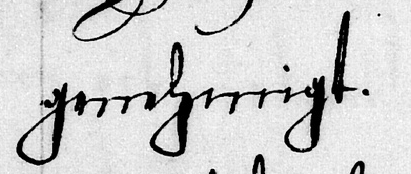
genehmigt.
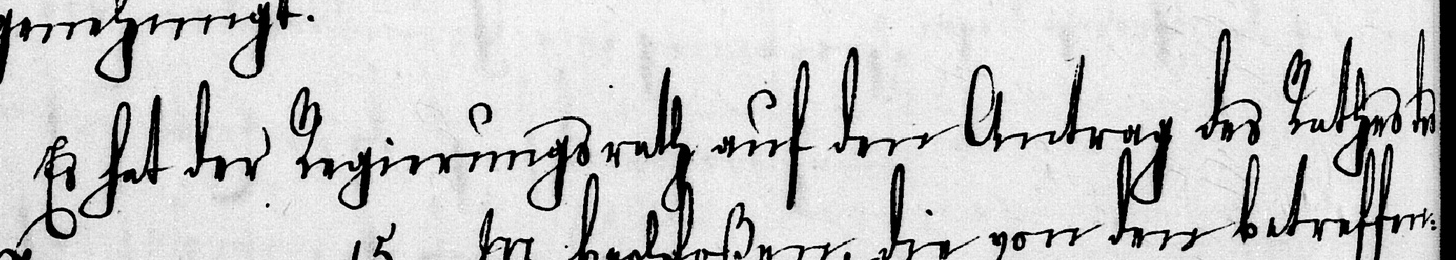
hat der Regierungsrath auf den Antrag des Rathes
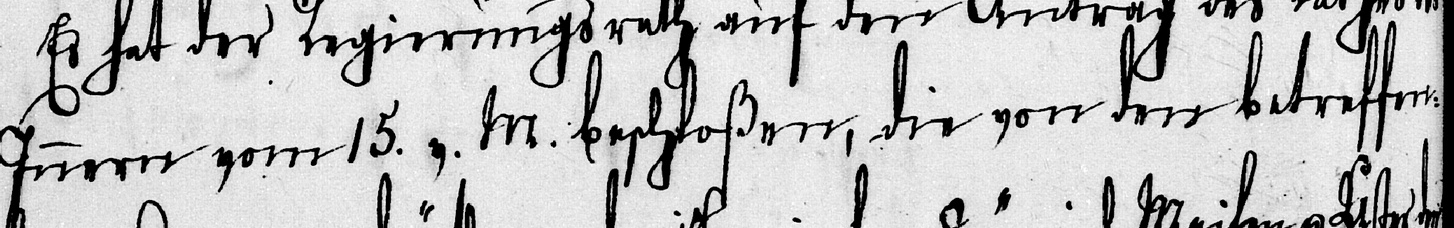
Innern vom 15. v. M. beschloßen, die von den betreffe¬
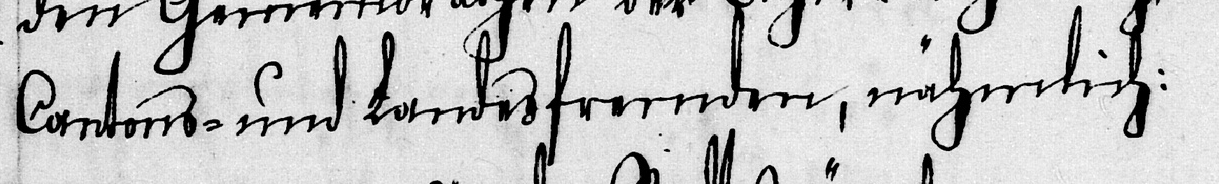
Cantons- und Landesfremden, nähmlich:
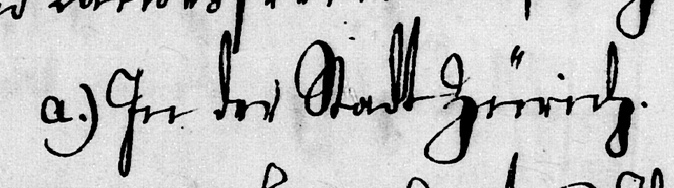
a.) In der Stadt Zürich.
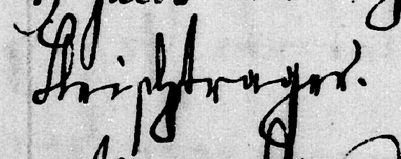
Fleischtrager.
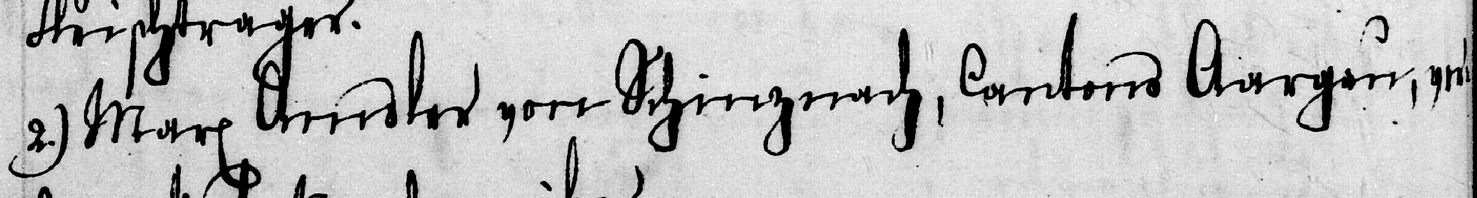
2.) Max Amsler von Schinznach, Cantons Aargau, ve¬
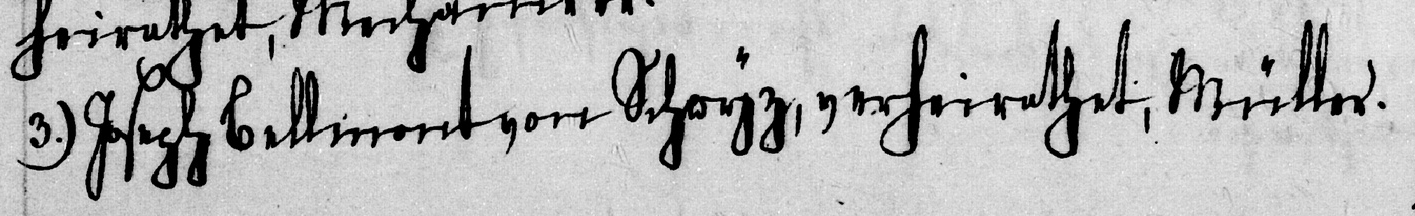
3.) Joseph Bellmont von Schwyz, verheirathet, Müller.
